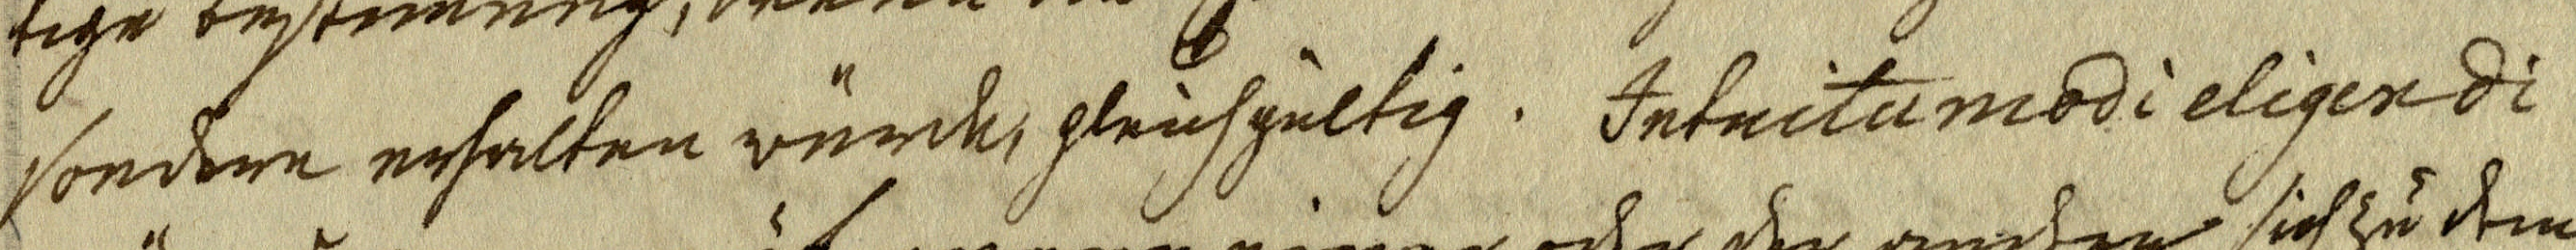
sondern erhalten würde, gleichgültig. Intuitu modi eligendi
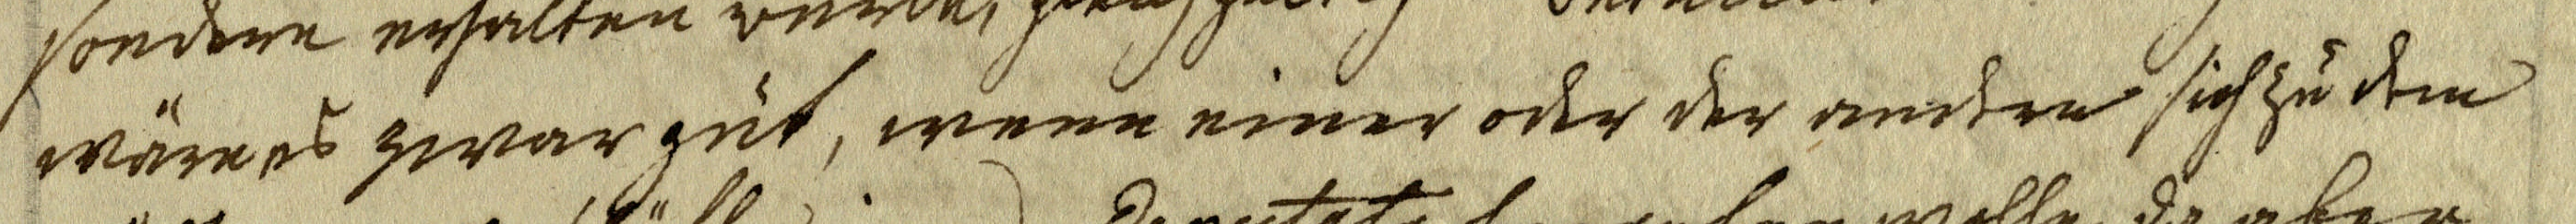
wäre es zwar gut, wenn einer oder der andere sich zu dem
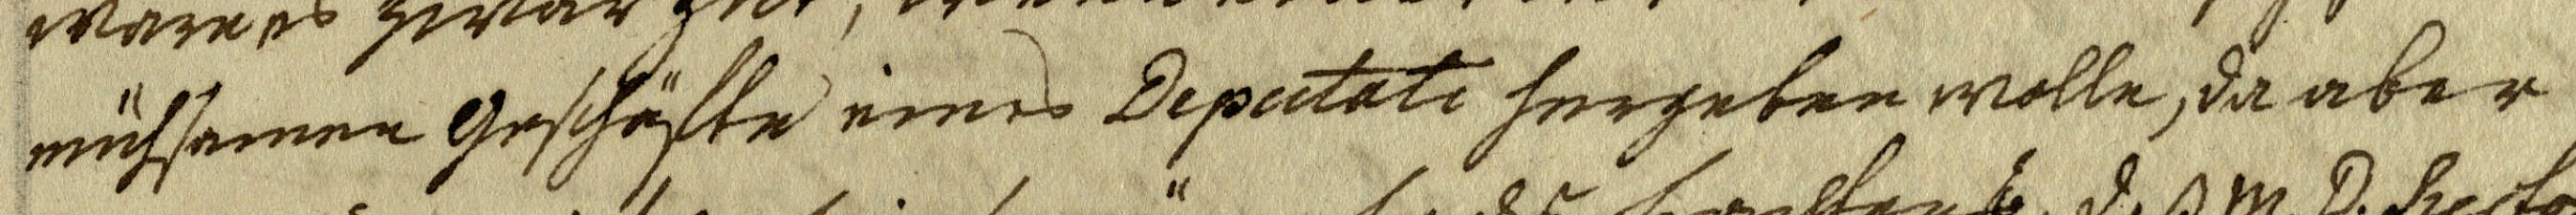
mühsamen Geschäfte eines Deputati hergeben wolle, da aber
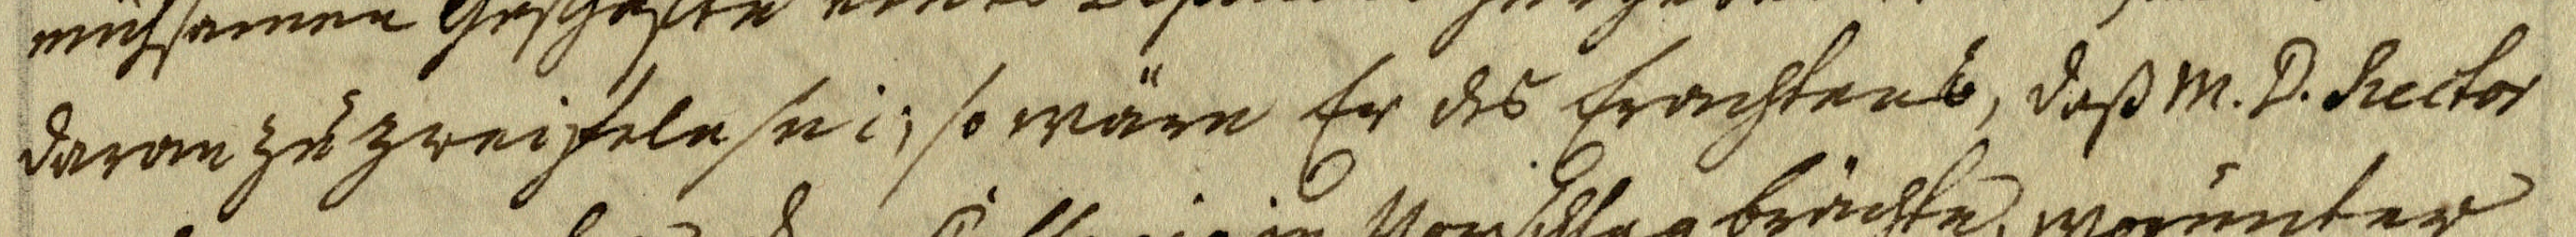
daran zu zweifeln sei, so wäre Er des Erachtens, daß M. D. Rector
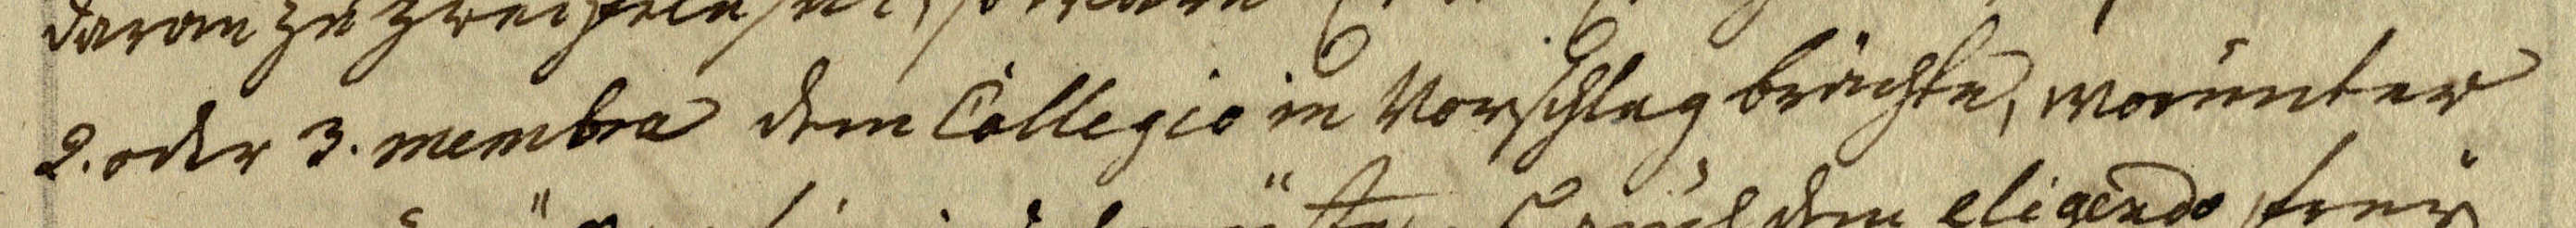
2. oder 3. membra dem Collegio in Vorschlag brächte, worunter
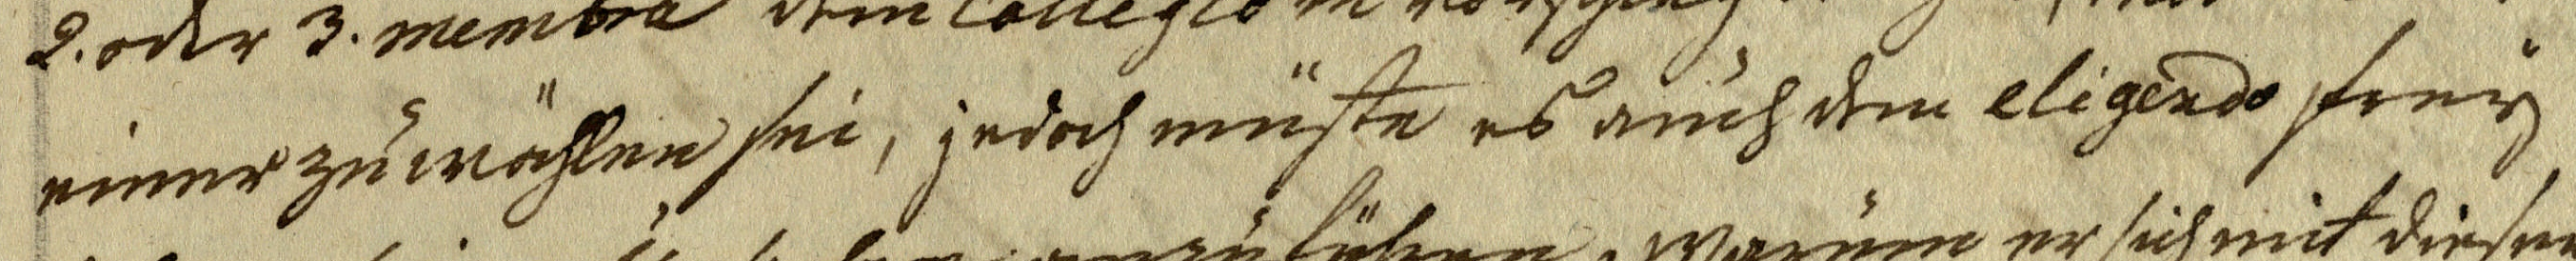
einer zu wählen sei, jedoch müßte es auch dem eligendo freÿ
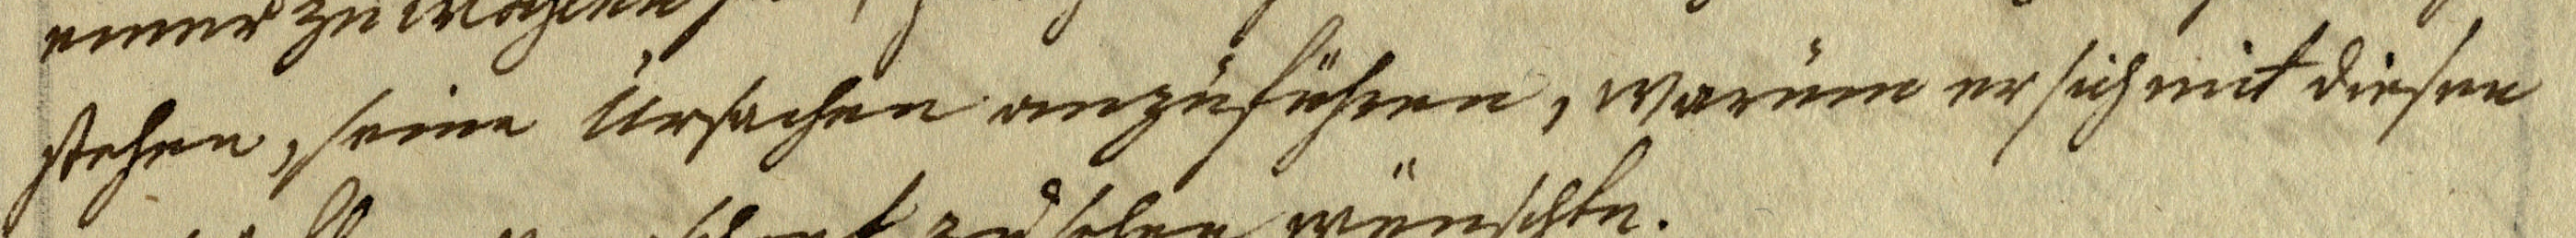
stehen, seine Ursachen anzuführen, warum er sich mit diesen
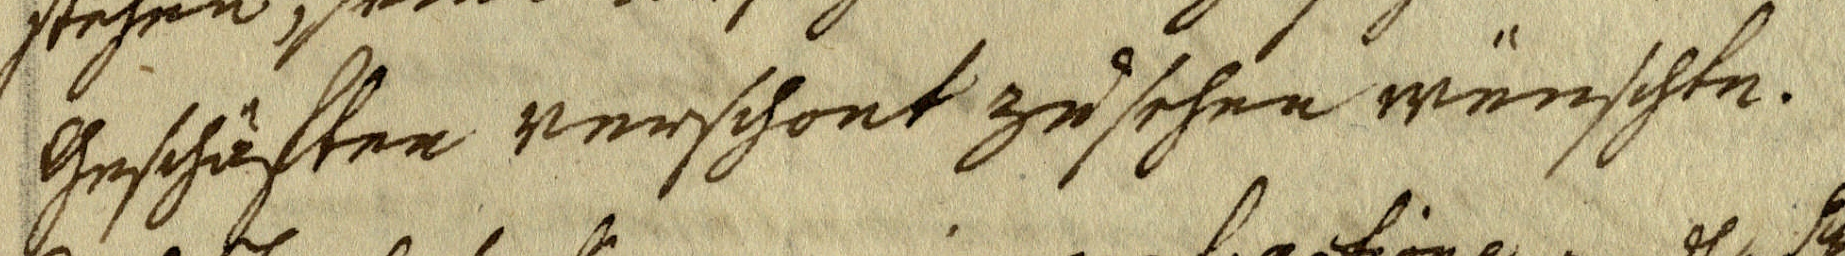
Geschäften verschont zu sehen wünschte.
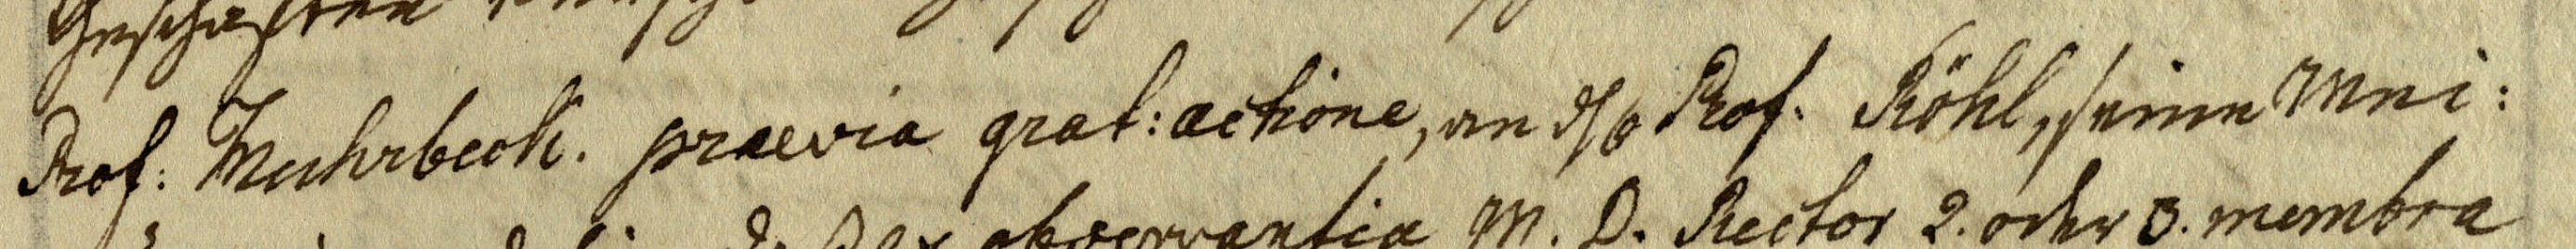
dh Prof. Muhrbeck. praevia grat.actione, an dh Prof. Röhl, seine Mei
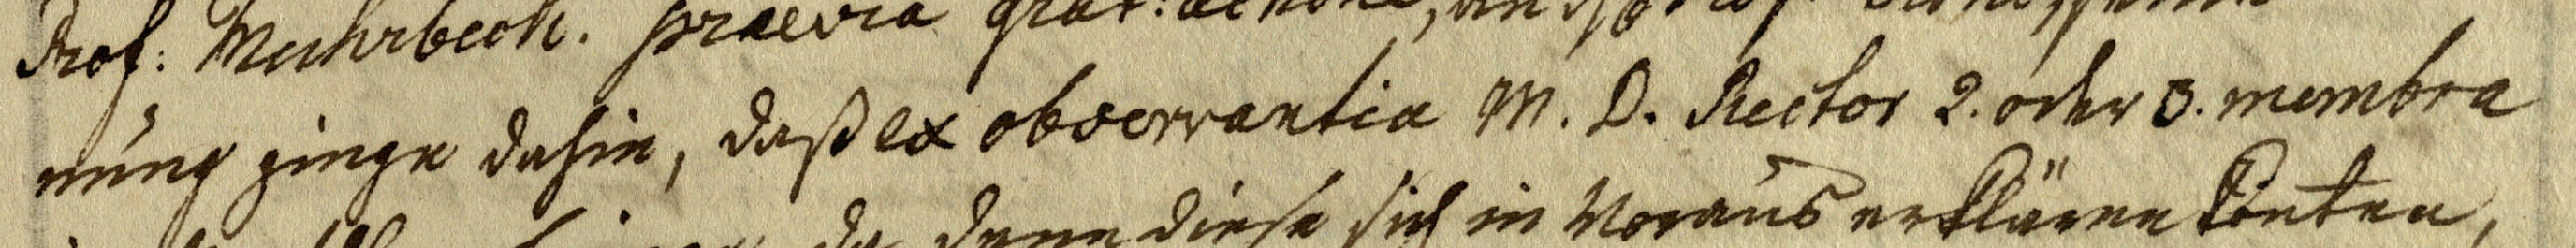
nung ginge dahin, daß ex observantia M. D. Rector 2. oder 3. membra
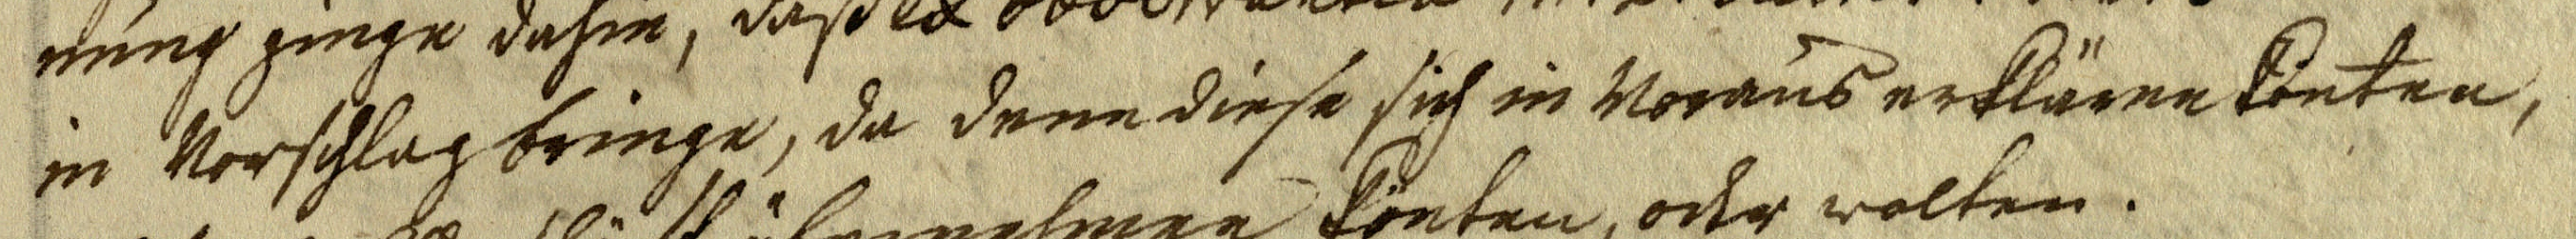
in Vorschlag bringe, da denn diese sich in voraus erklären könten,
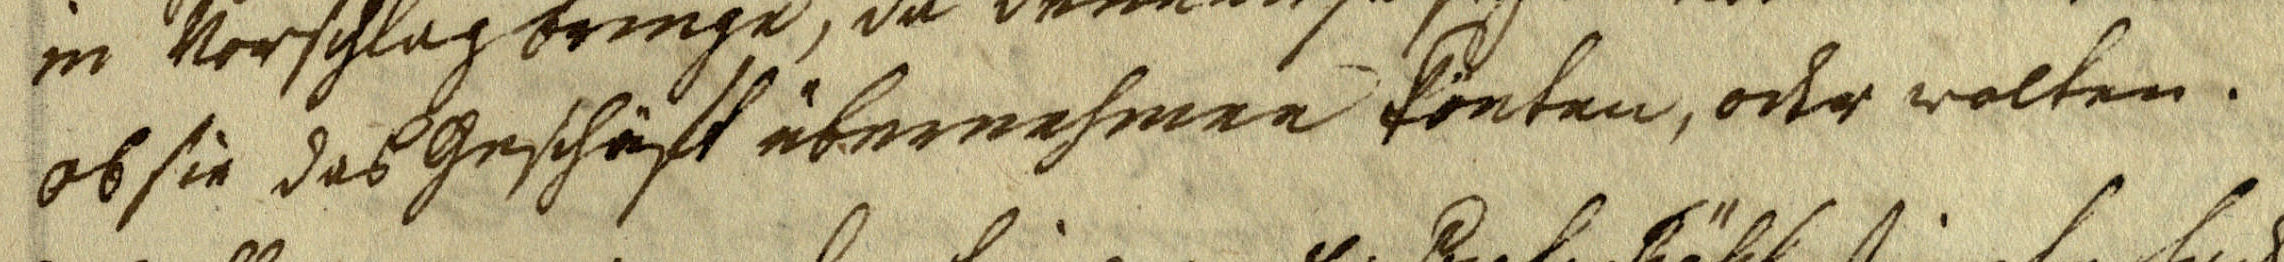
ob sie das Geschäft übernehmen könten, oder wolten.
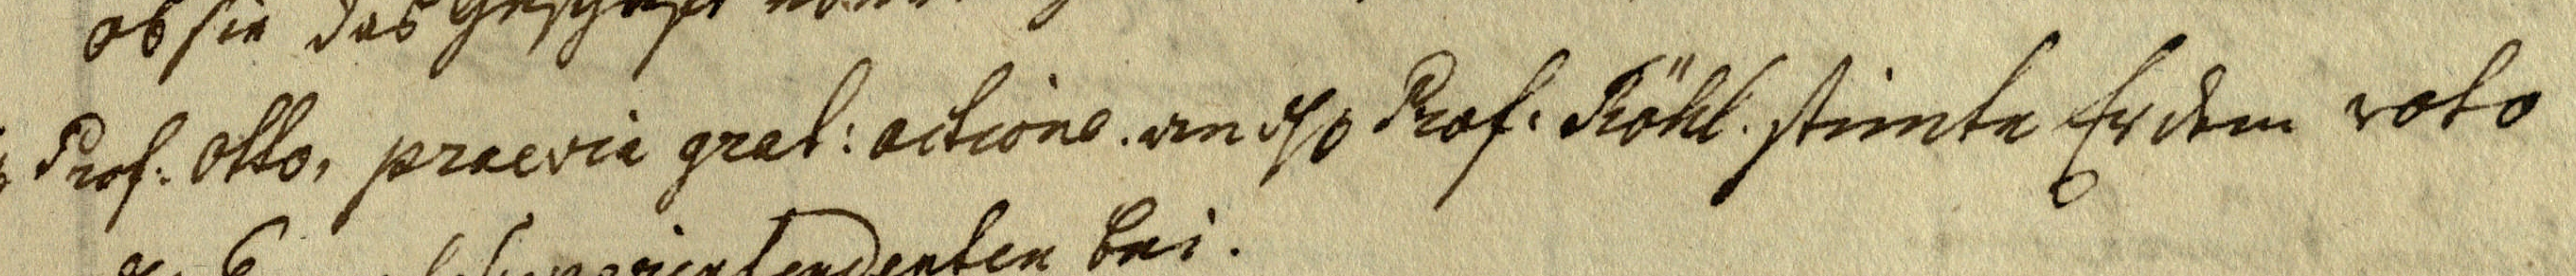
dh Prof. Otto, praevia grat. actione. an dh Prof: Röhl, stimte Er dem voto
